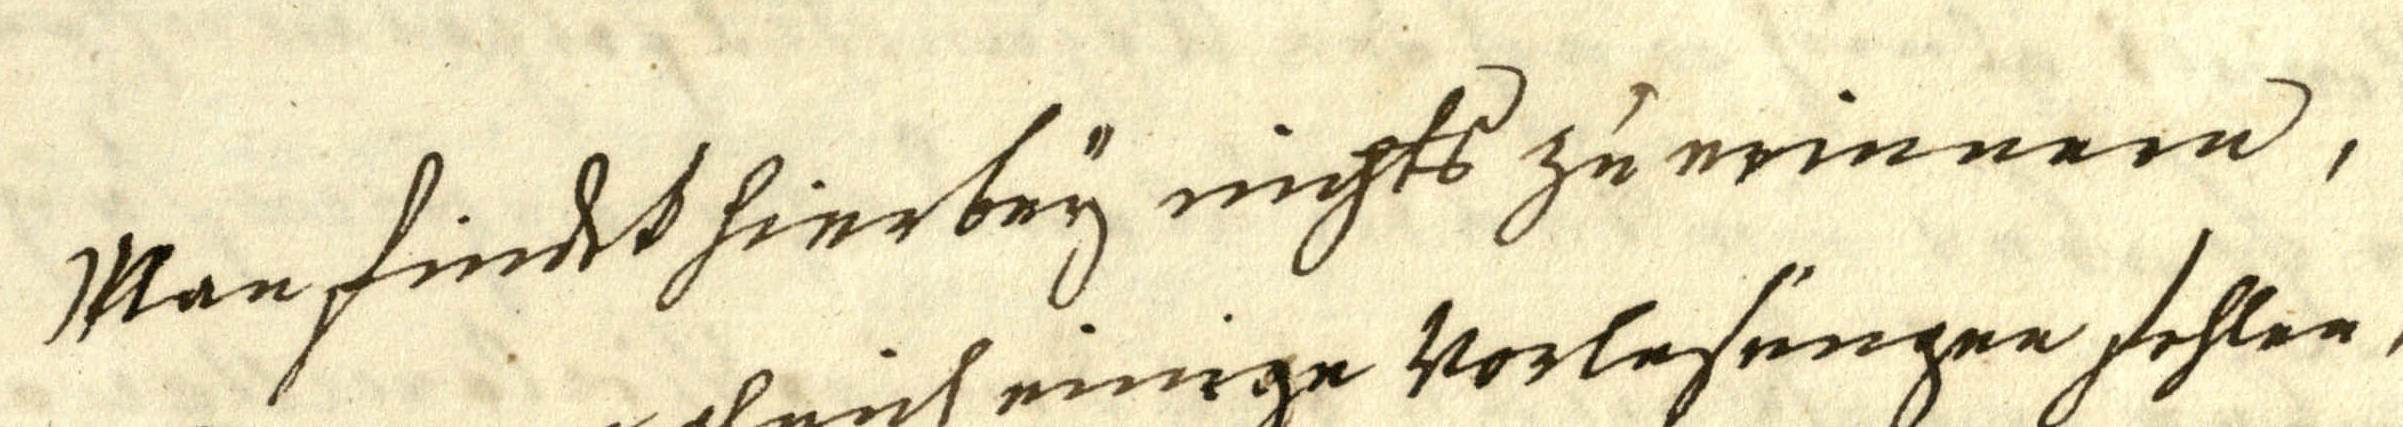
Man findet hierbeÿ nichts zu erinnern,
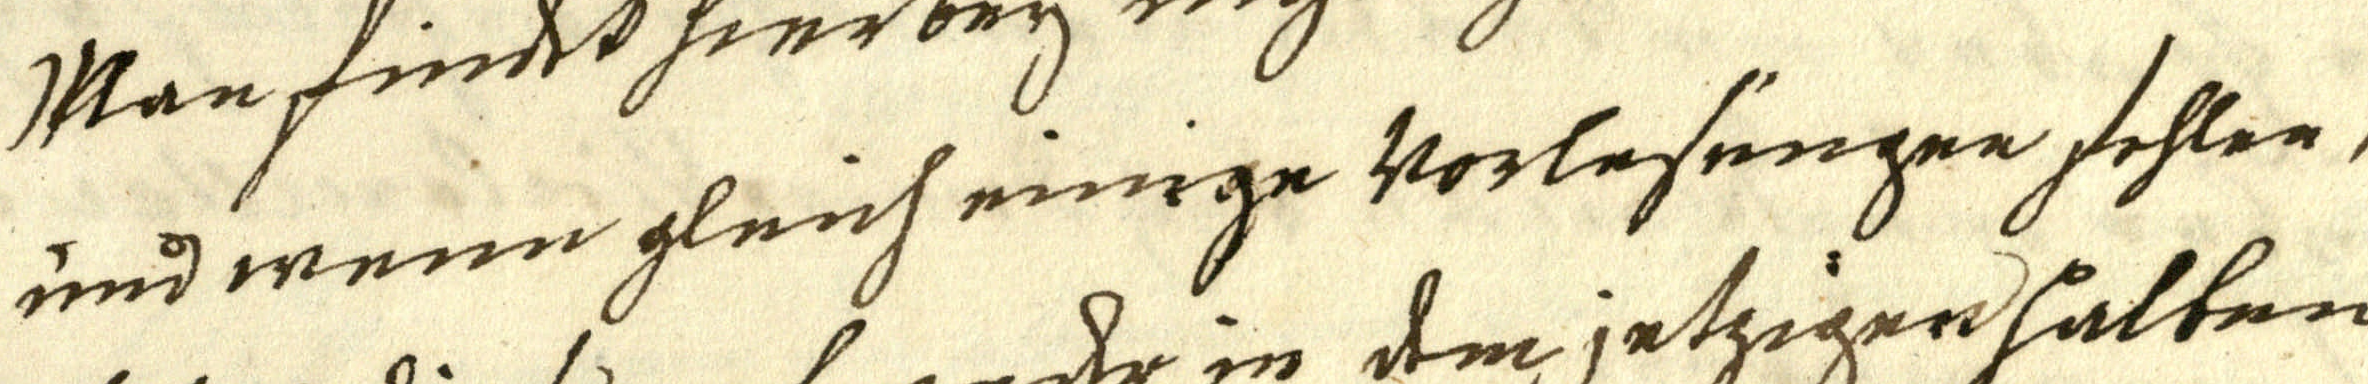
und wenn gleich einige Vorlesungen fehlen,
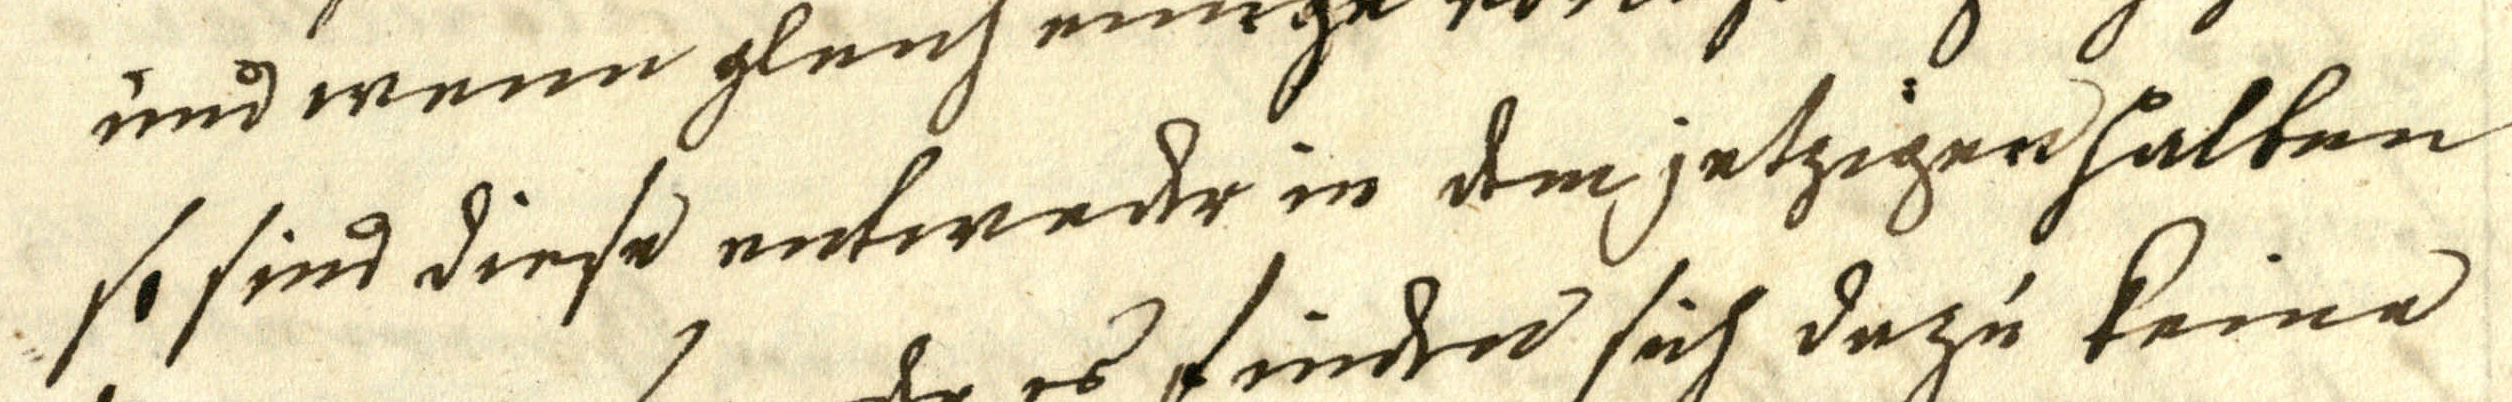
so sind diese entweder in dem jetzigen halben
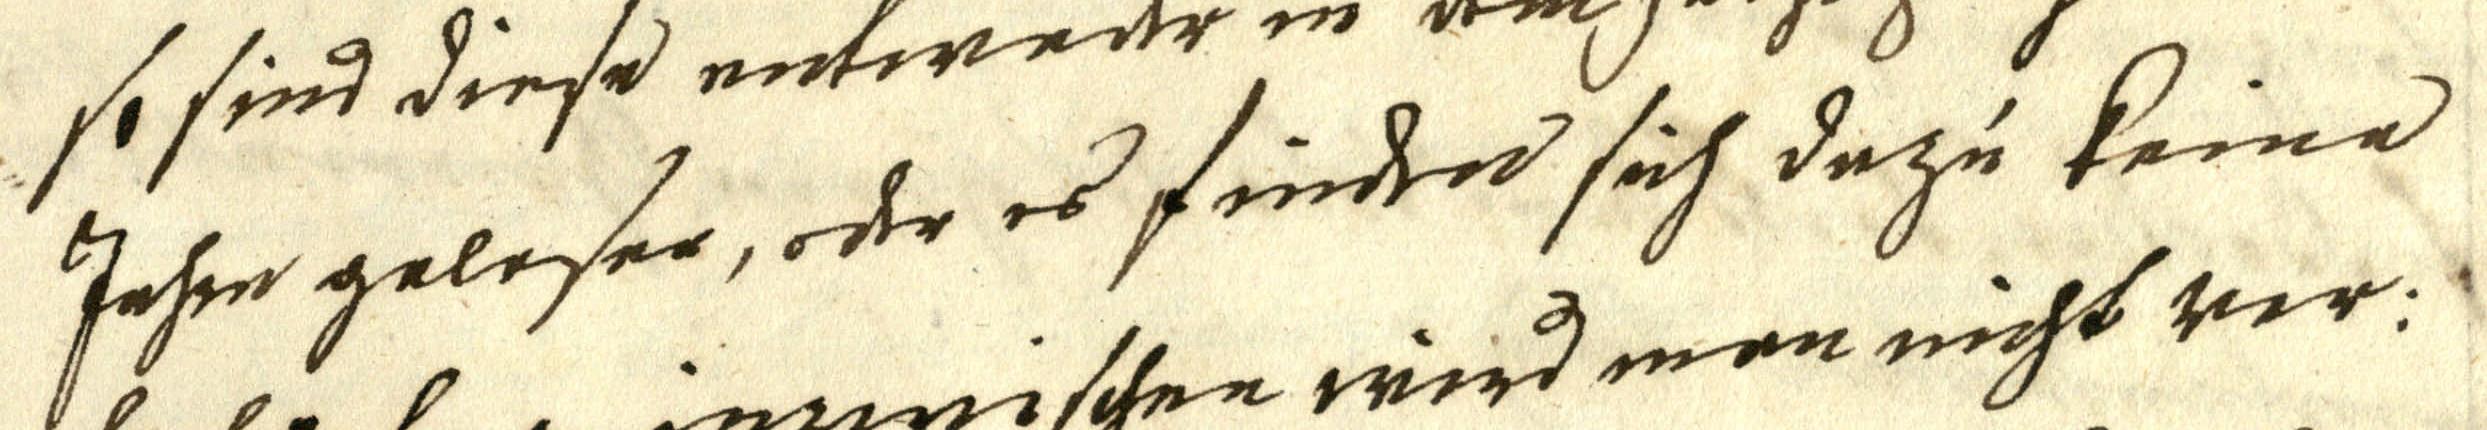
Jahre gelesen, oder es finden sich dazu keine
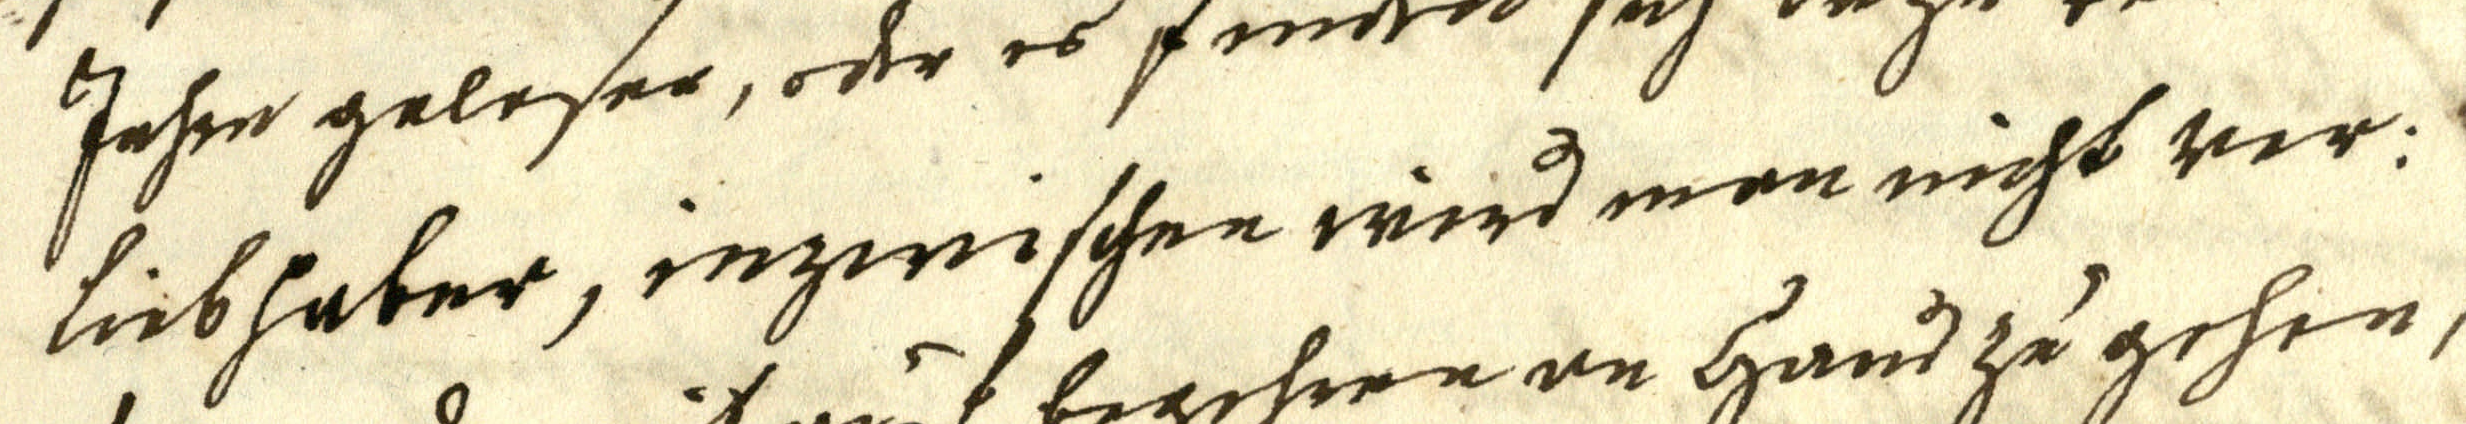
Liebhaber, inzwischen wird man nicht ver¬
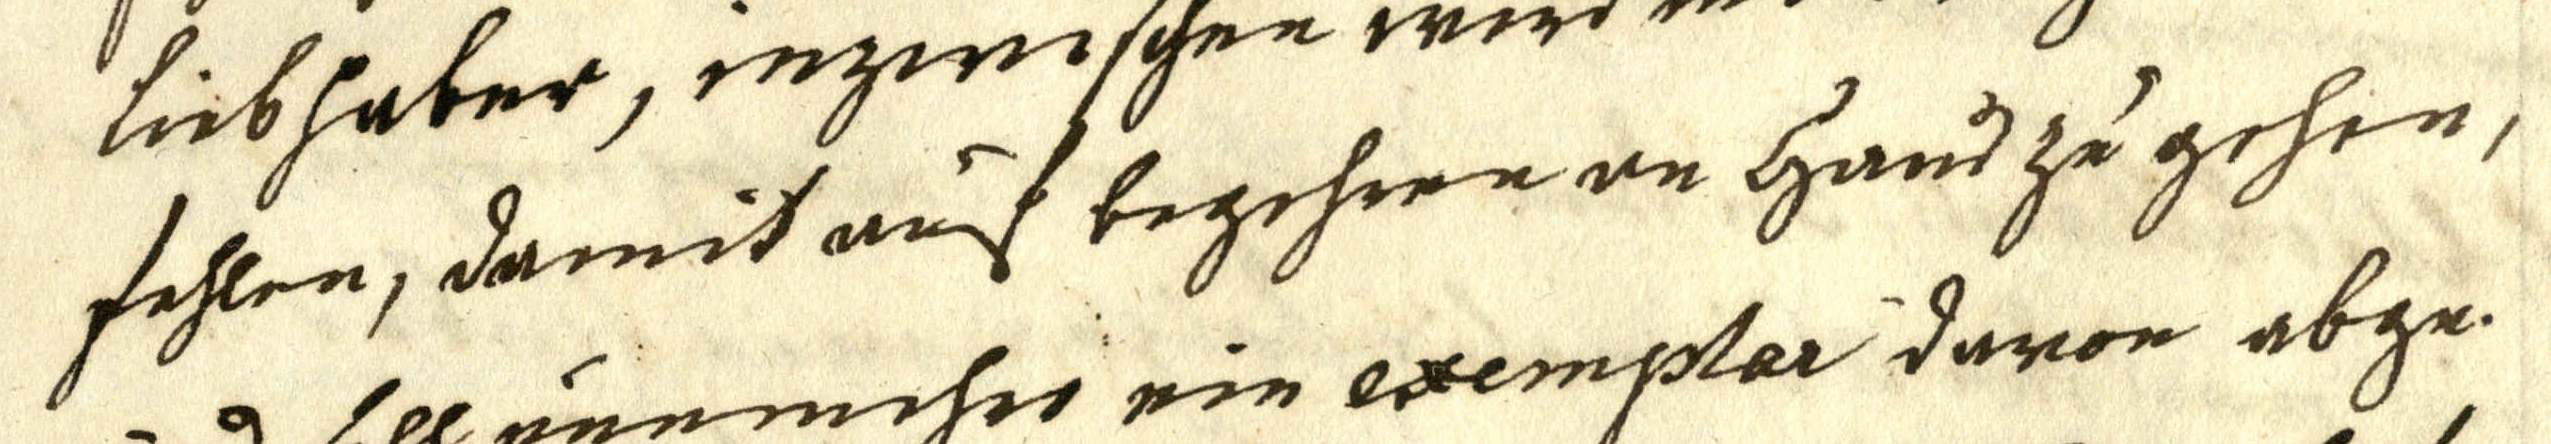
fehlen, damit auf Begehren an Hand zu gehen,
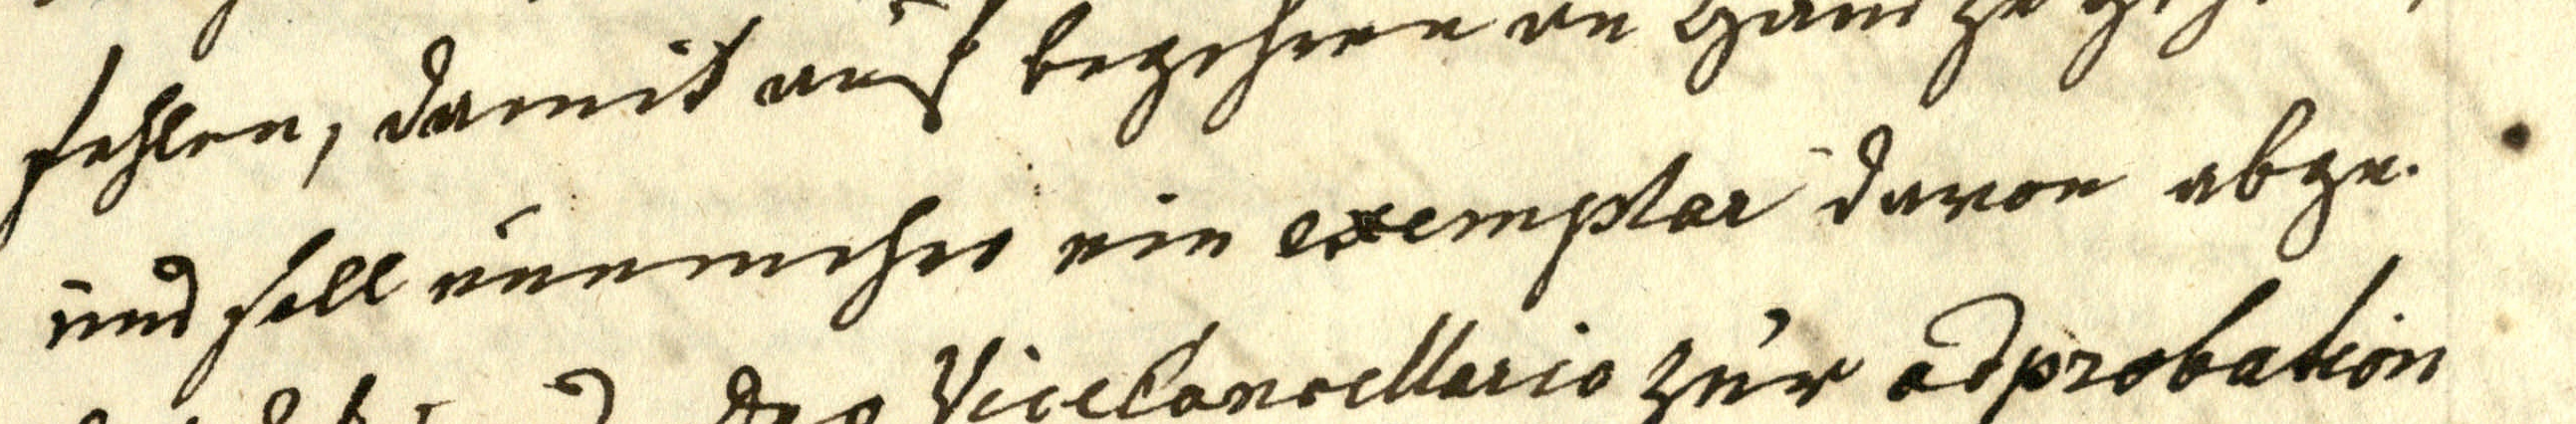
und soll nunmehro ein exemplar davon abge¬
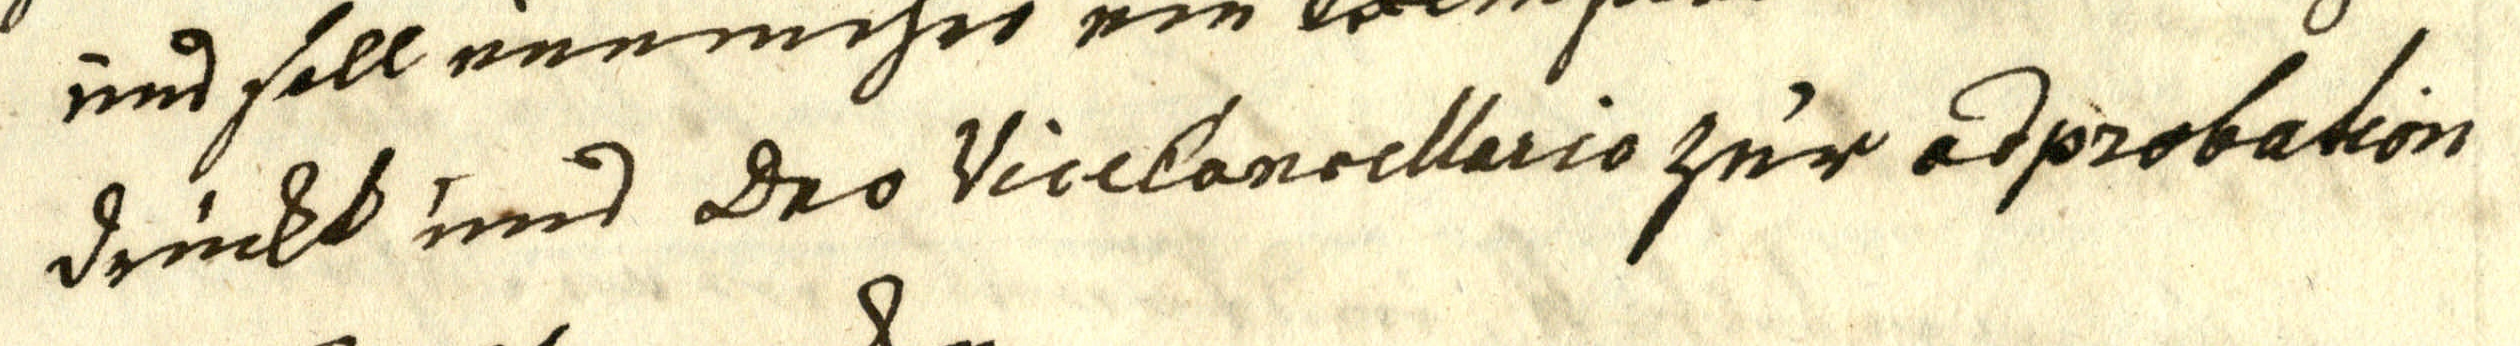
druckt und Dno ViceCancellario zur adprobation
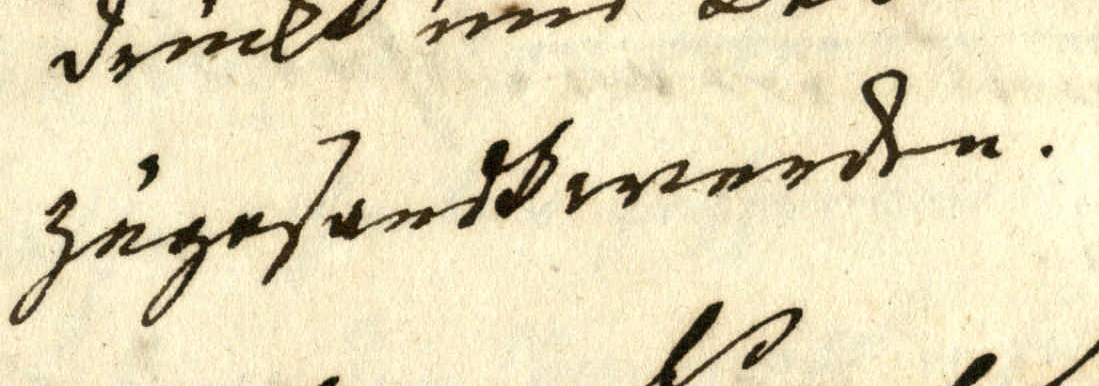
zugesandt werden.
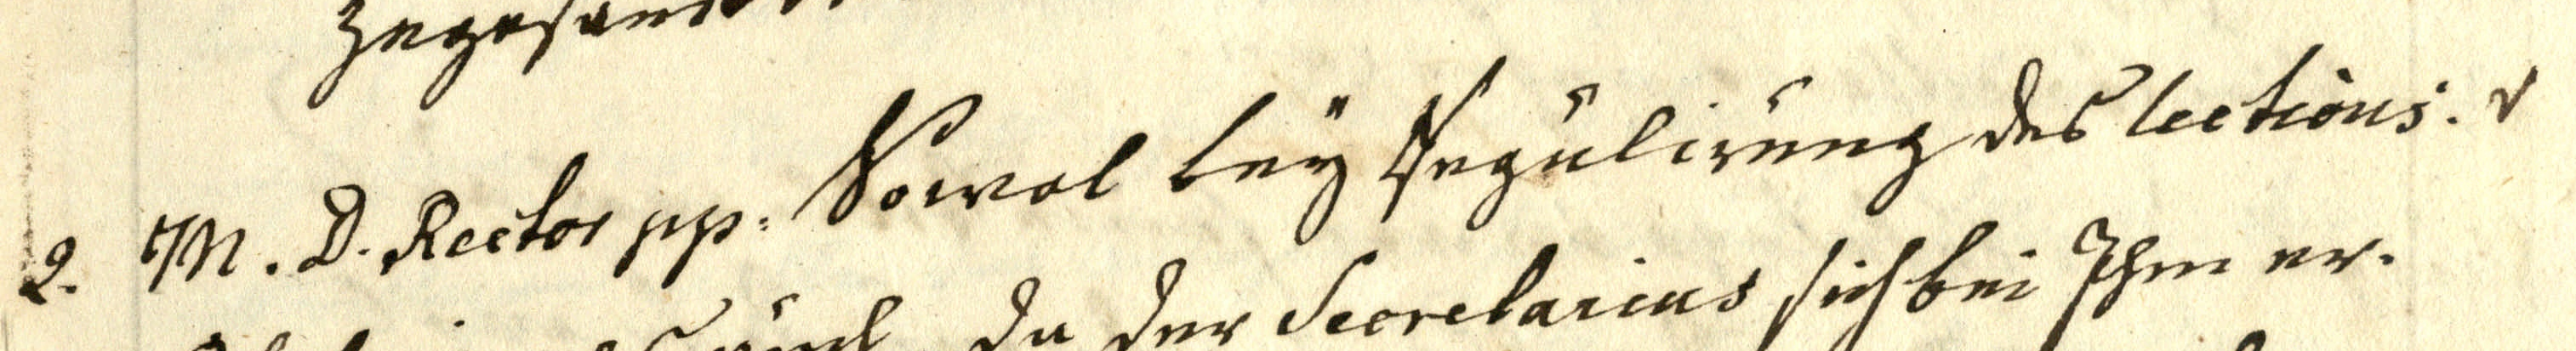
2. M. D. Rector pp. Sowol beÿ Regulirung des Lections
